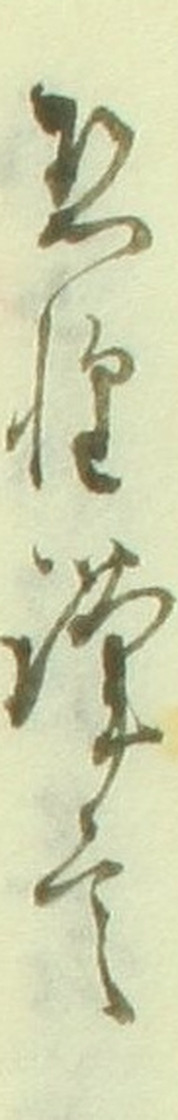恐惶謹言
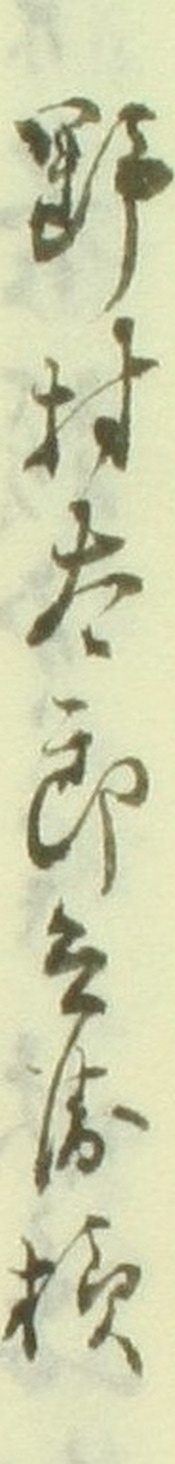野村太郎兵衛様
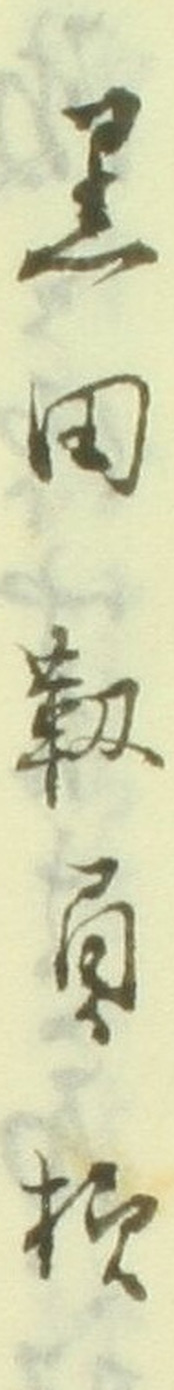黒田靭負様
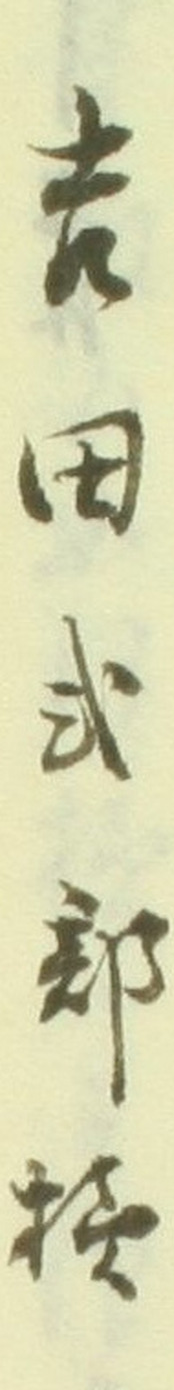吉田式部様
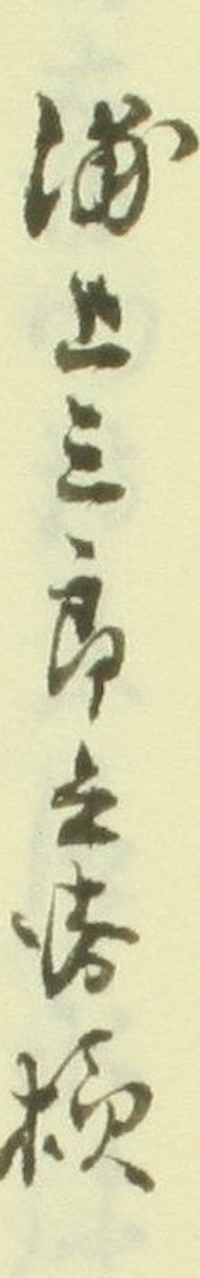浦上三郎兵衛様
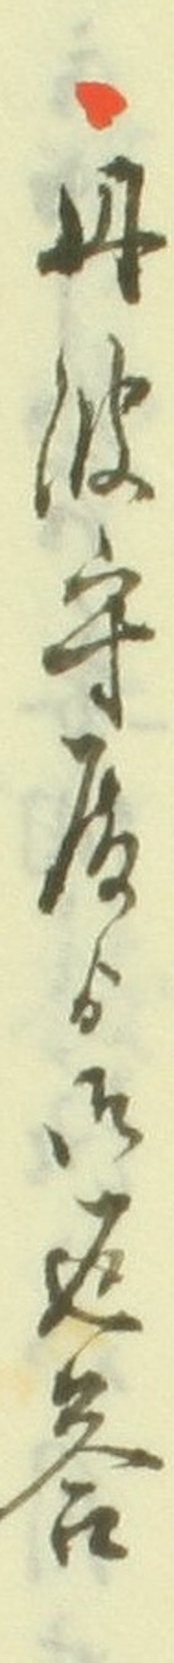丹波守殿ゟ御返答
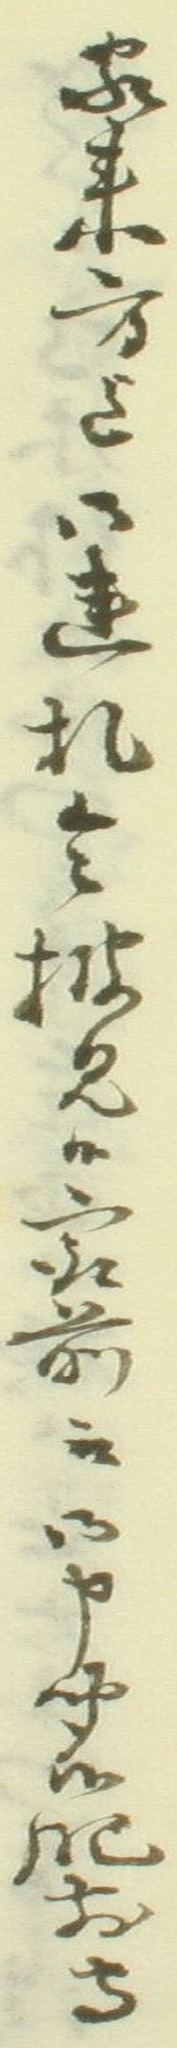家来方迄御連札令被遣候最前被御申聞候肥前守
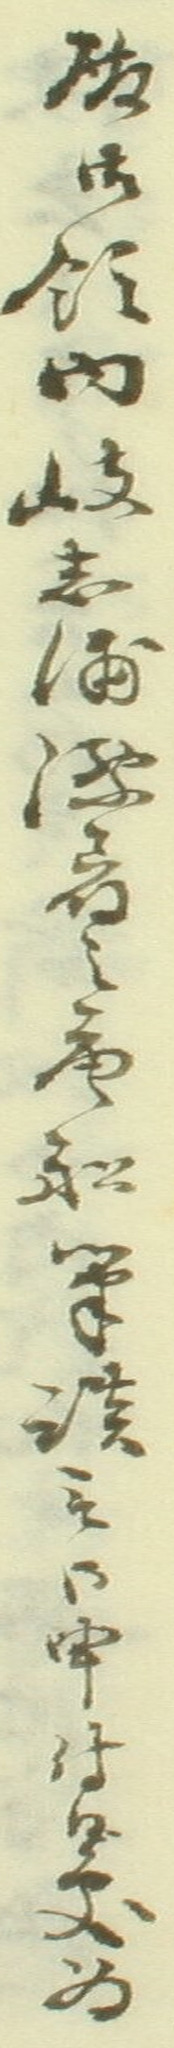殿御御領内岐志浦漂着之唐船筆談被御申付候処為
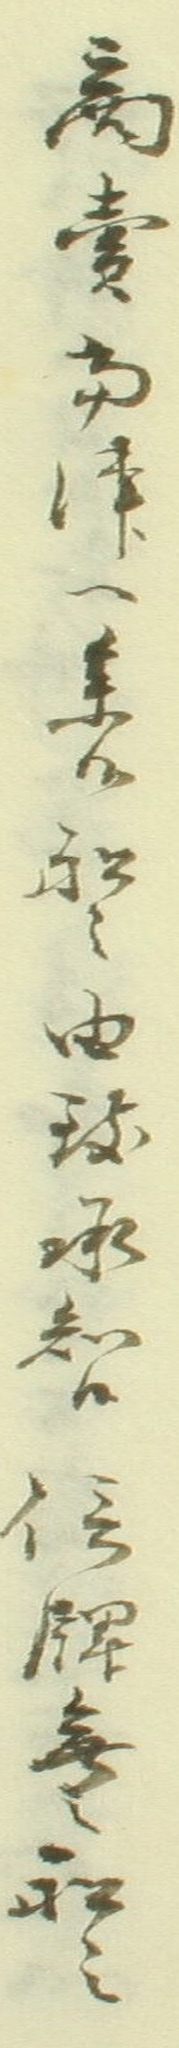商売当津へ参候船之由致承知候信牌無之船之
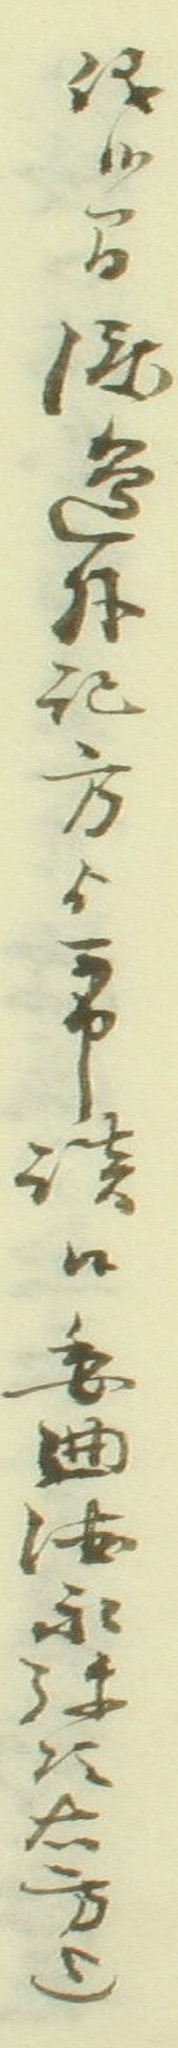儀候間渡辺外記方ゟ可申談候委曲徳永弥次右方迄
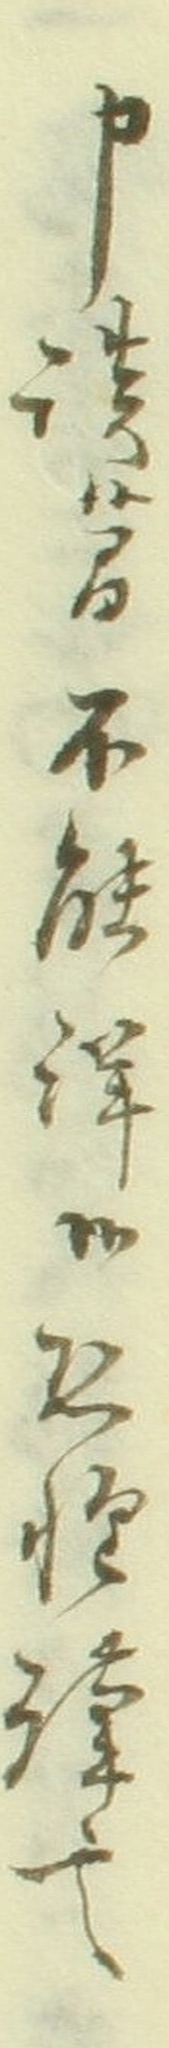申談候間不能詳候恐惶謹言
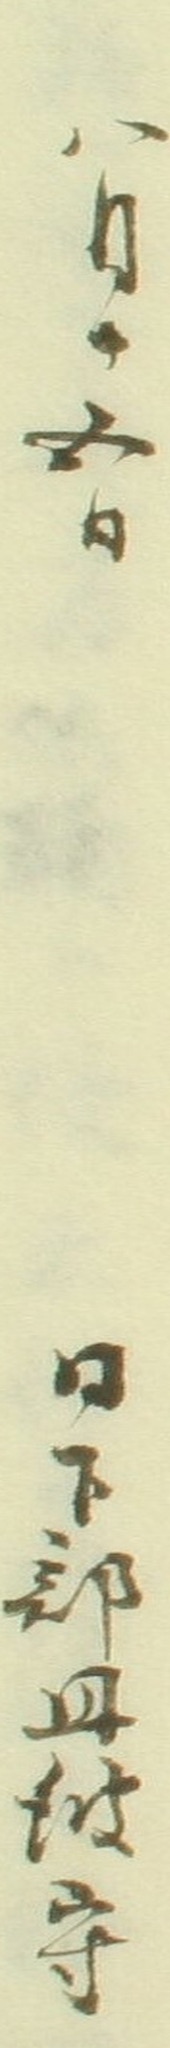八月十五日日下部丹波守
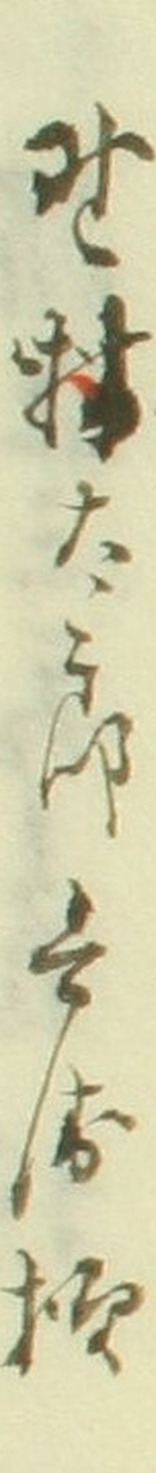野村太郎兵衛様
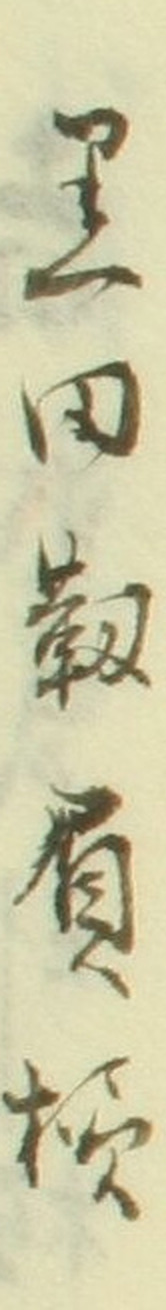黒田靭負様

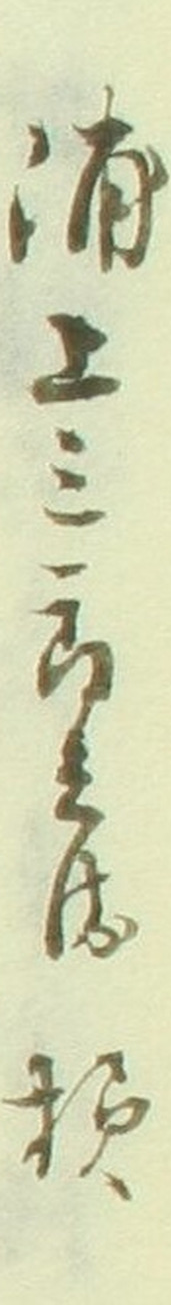浦上三郎兵衛様
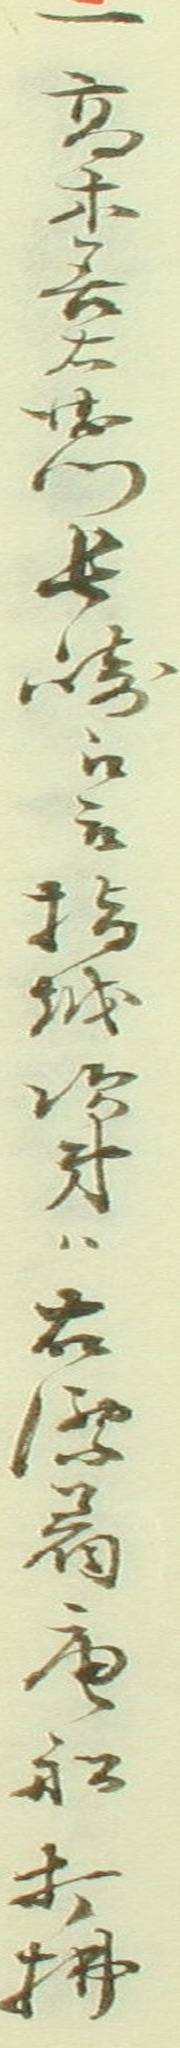一高木善右衛門長崎え被指越次第は右漂着唐船打払
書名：異国船漂着記
